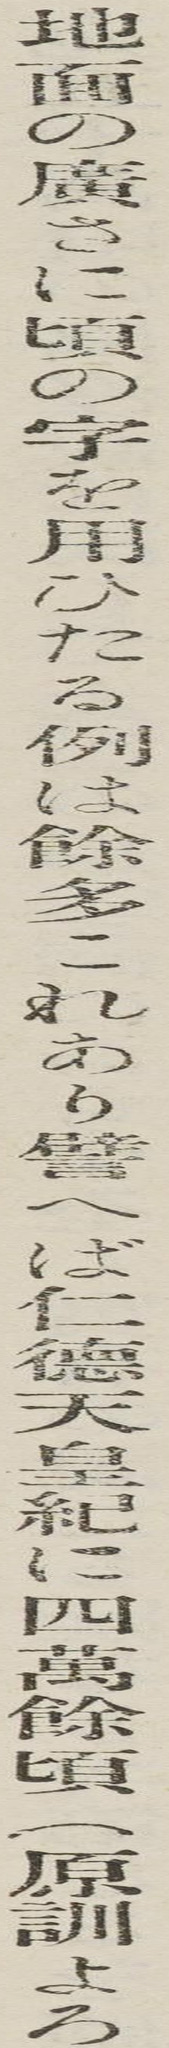地面の広さに頃の字を用ひたる例は余多これあり譬へば仁徳天皇紀に四万余頃（原訓よろ
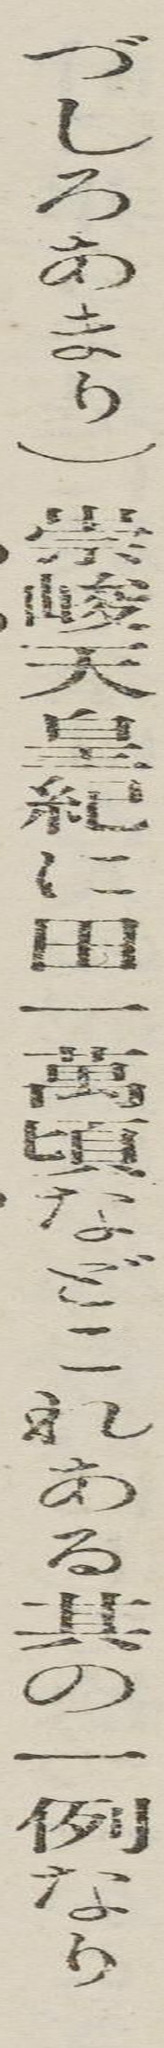づしろあまり）崇峻天皇紀に田一万頃などこれある其の一例なり
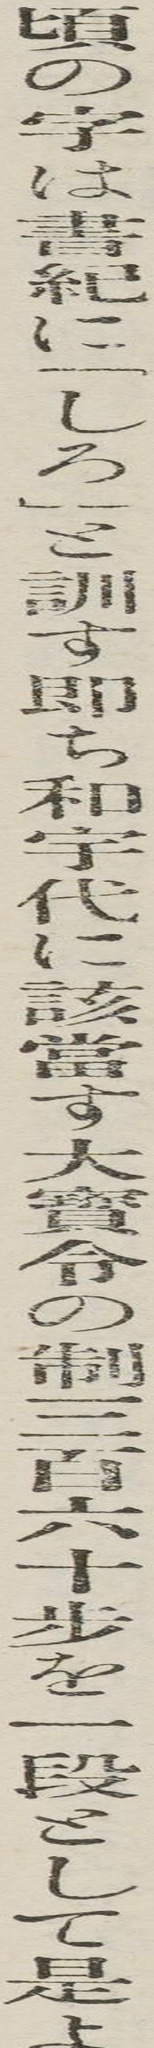頃の字は書紀に「しろ」と訓す即ち和宇代に該当す大宝令の制三百六十歩を一段として是よ
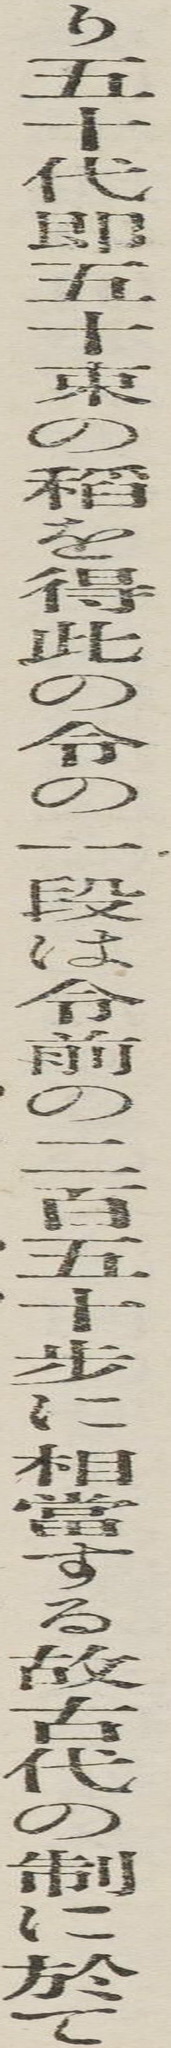り五十代即五十束の稲を得此の令の一段は令前の二百五十歩に相当する故古代の制に於て
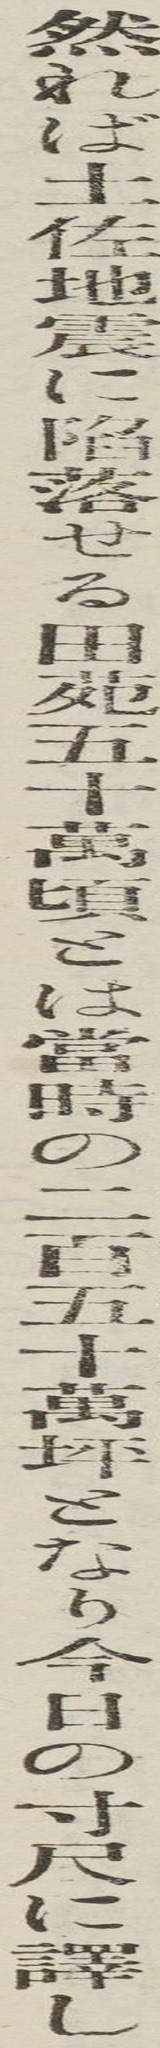然れば土佐地震に陥落せる田苑五十万頃とは当時の二百五十万坪となり今日の寸尺に訳し

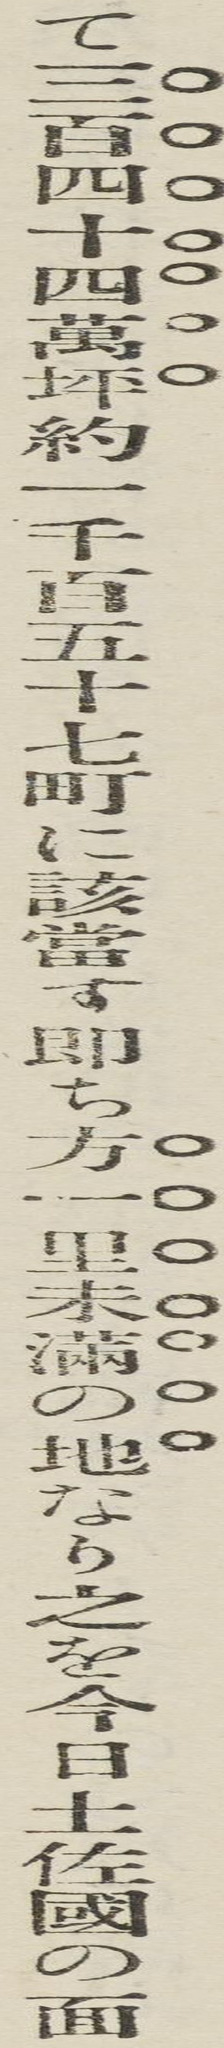て三百四十四万坪約一千百五十七町に該当す即ち方一里未満の地なり之を今日土佐国の面
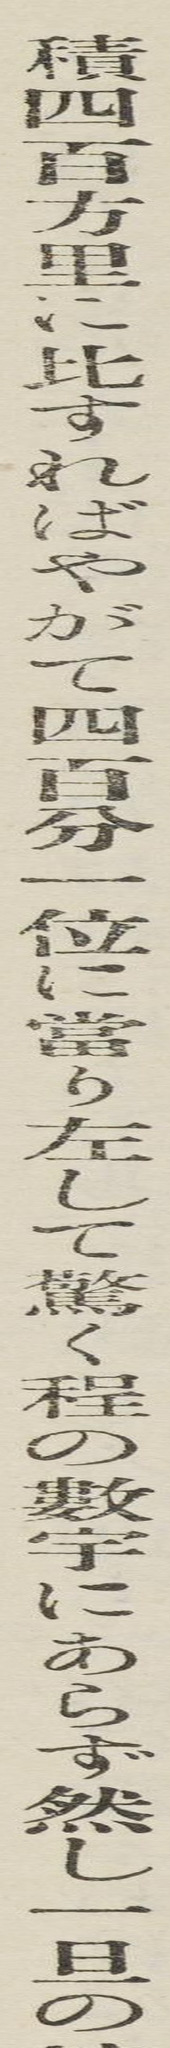積四百方里に比すればやがて四百分一位に当り左して驚く程の数宇にあらず然し一旦の地
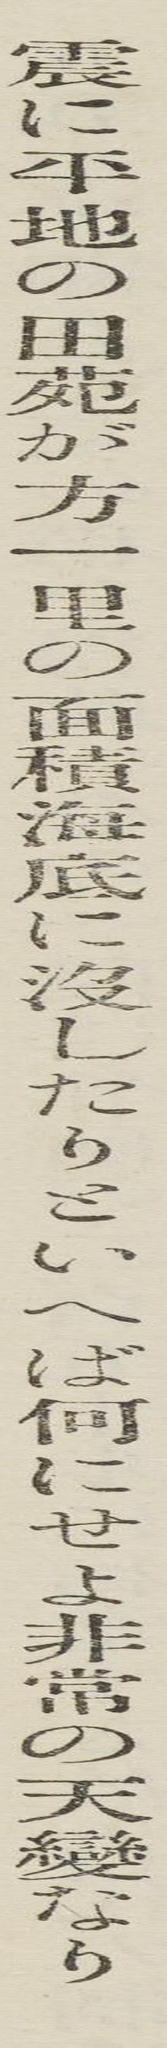震に平地の田苑が方一里の面積海底に没したりといへば何にせよ非常の天変なり
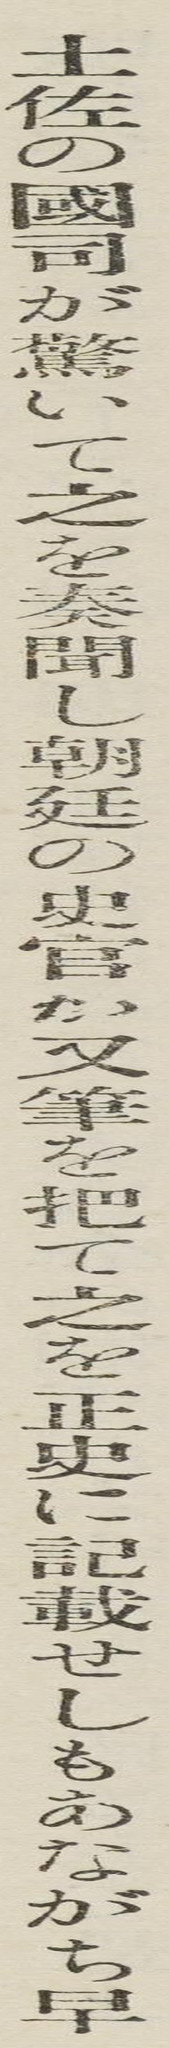土佐の国司が驚いて之を奏聞し朝廷の史官か又筆を把て之を正史に記載せしもあながち早
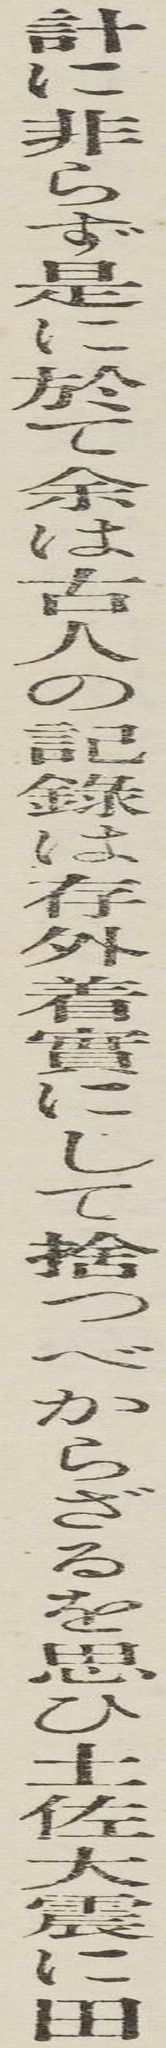計に非らず是に於て余は古人の記録は存外着実にして捨つべからざるを思ひ土佐大震に田
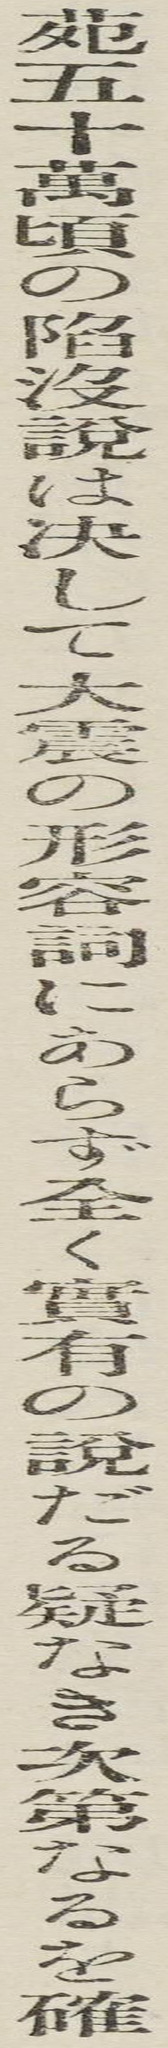苑五十万頃の陥没説は決して大震の形容詞にあらず全く実有の説たる疑なき次第なるを確
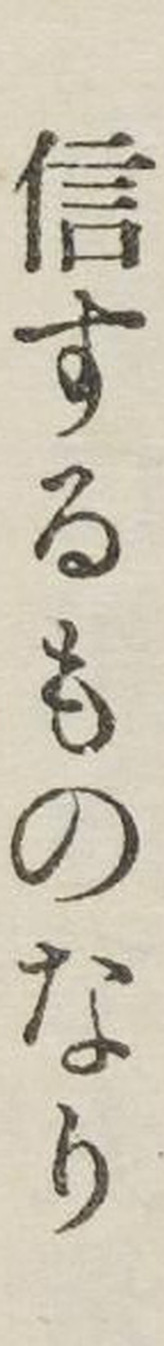信するものなり
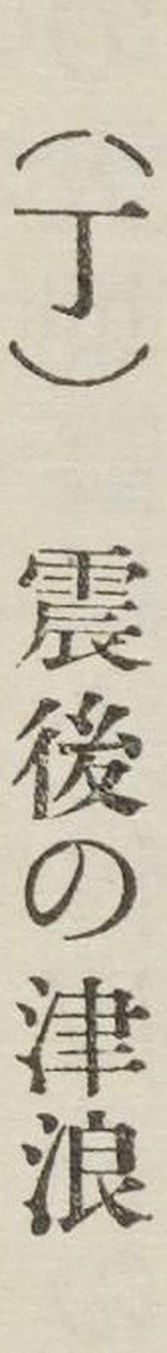震後の津浪
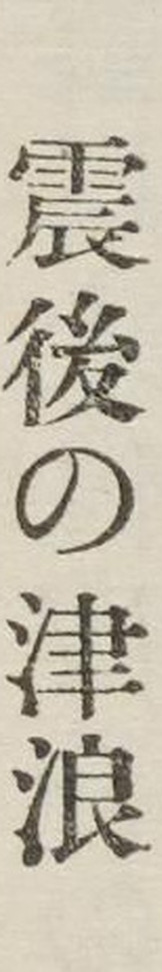震後の津浪
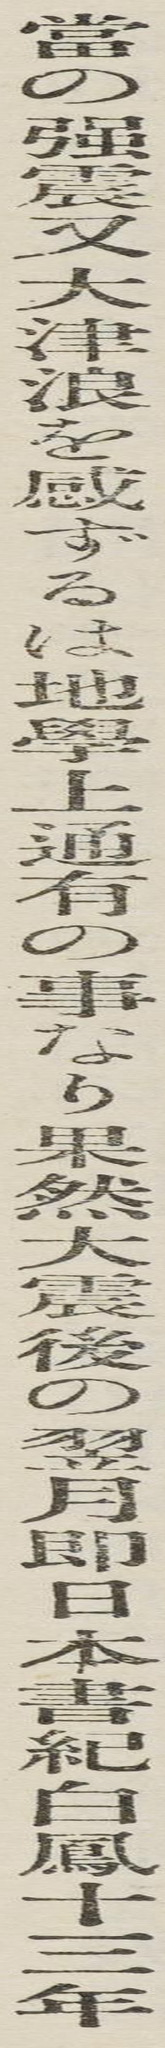当の強震又大津浪を感ずるは地学上通有の事なり果然大震後の翌月即日本書紀白鳳十三年
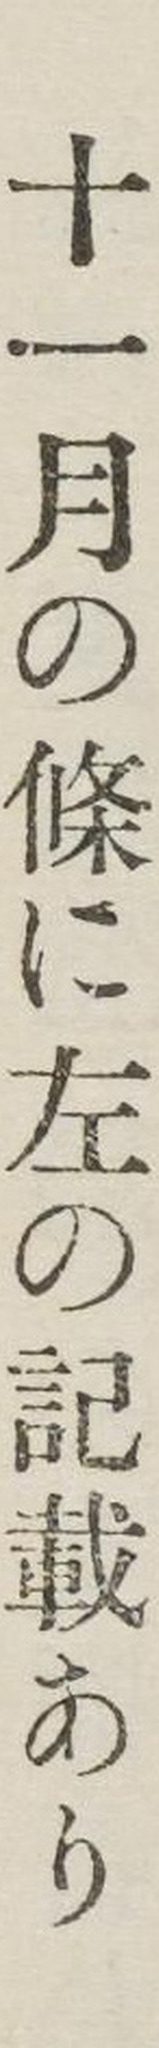十一月の条に左の記載あり
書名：土佐古今ノ地震
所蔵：東京大学地震研究所図書室 Earthquake Research Institute Library, The University of Tokyo, JAPAN
